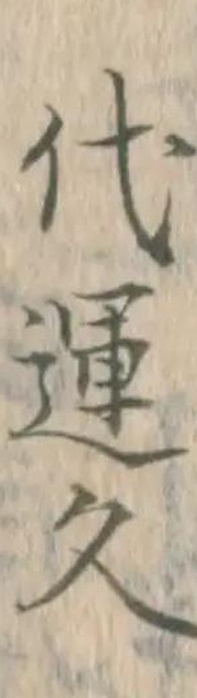代運久
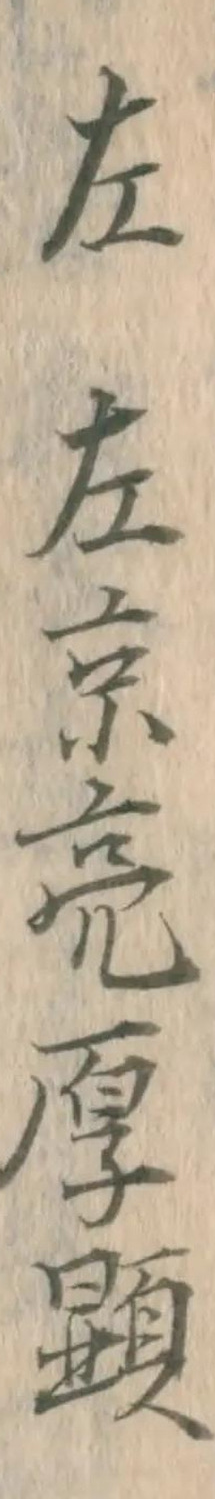左左京亮厚顕
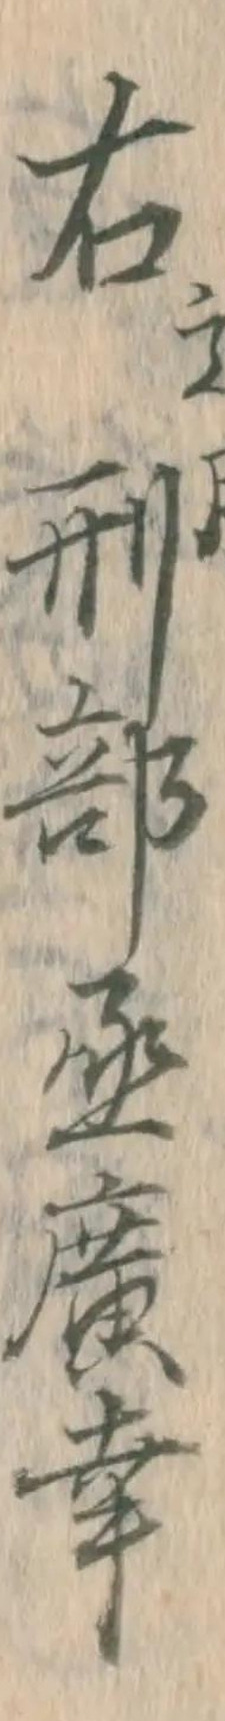右刑部丞広幸
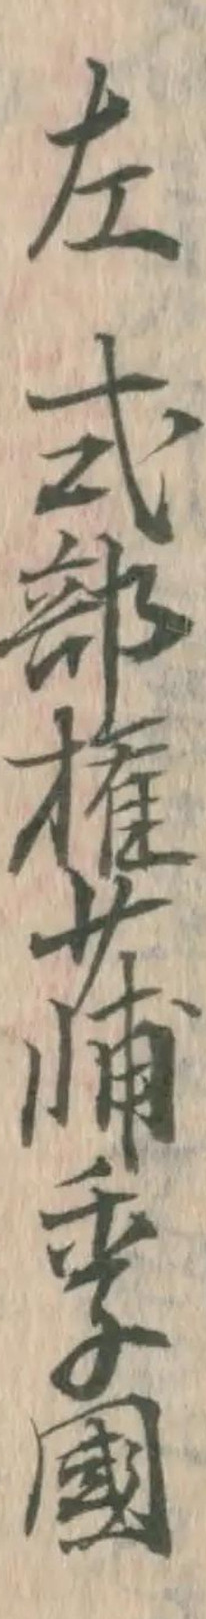左式部権少輔季国
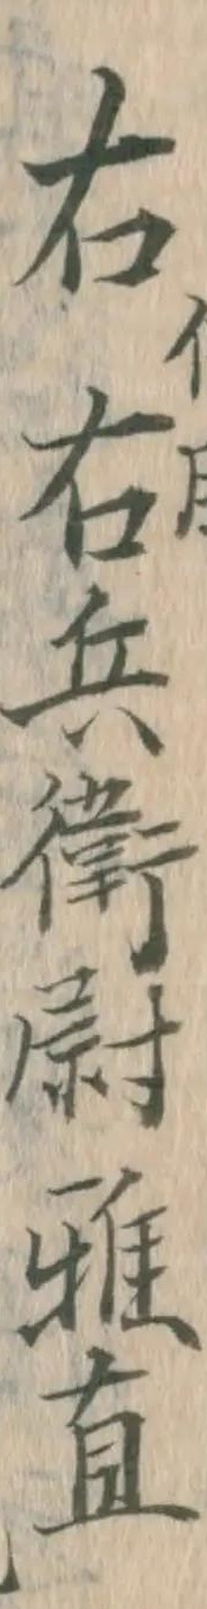右右兵衛尉雅直
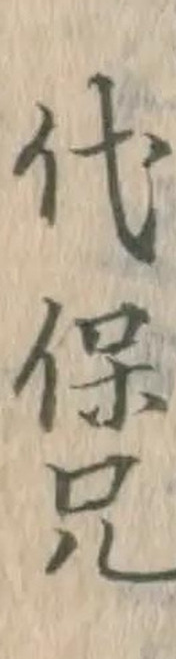代保兄
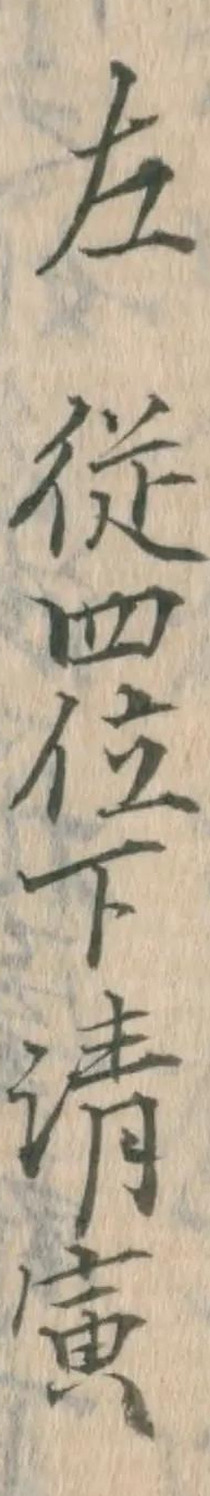左従四位下清寅
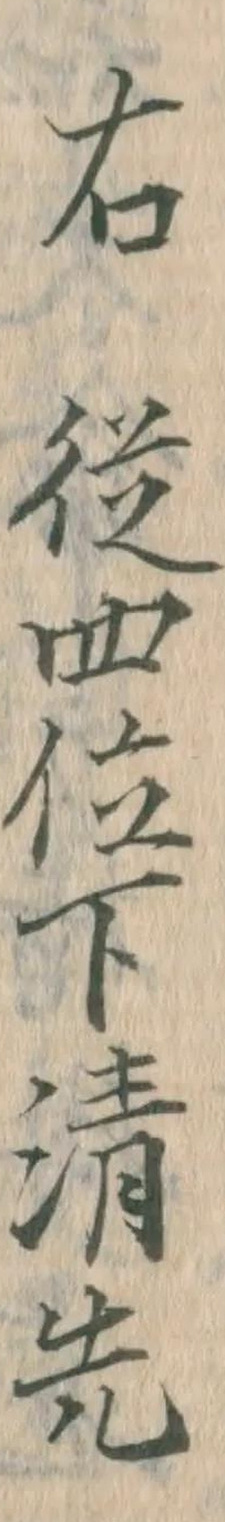右従四位下清先
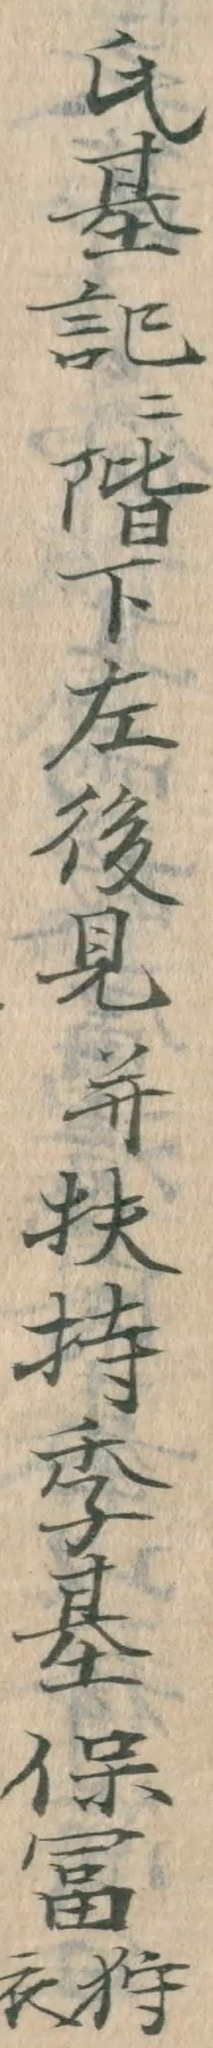氏基記ニ階下左後見并扶持季基保富狩衣
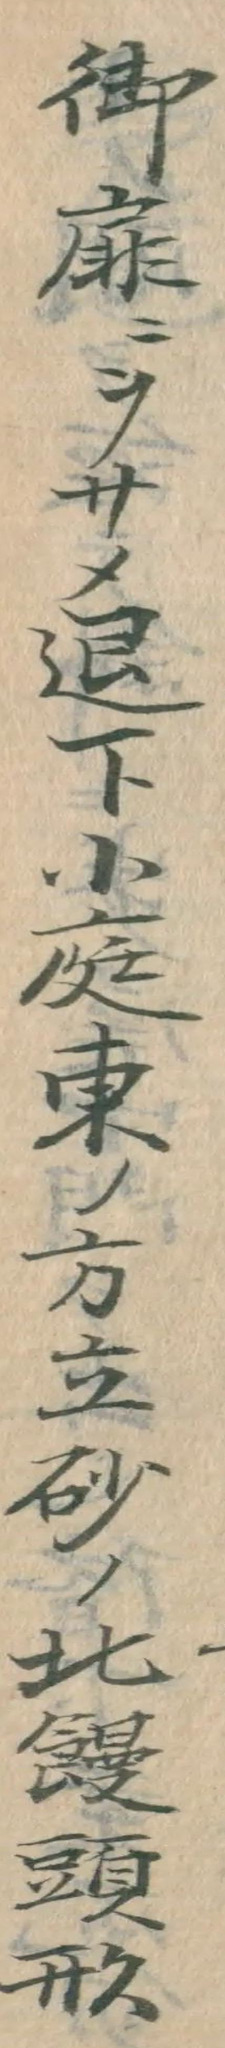御扉ニヲサメ退下小庭東ノ方立砂ノ北饅頭形

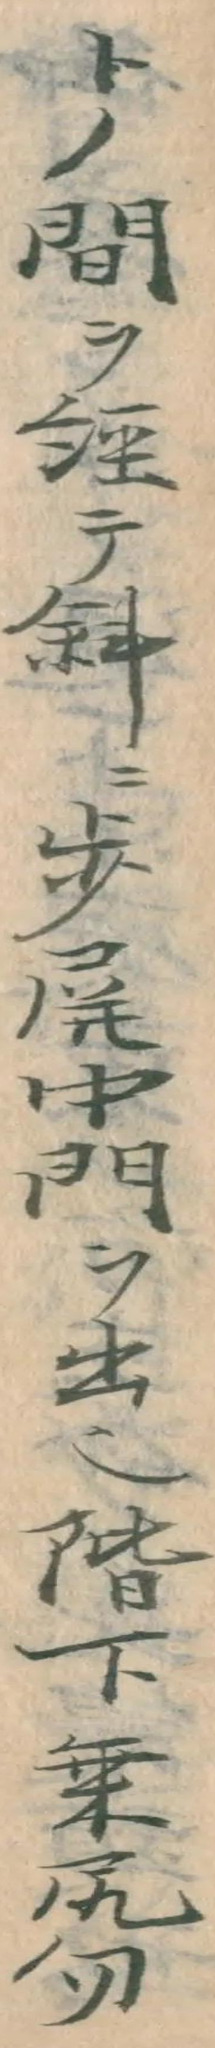トノ間ヲ経テ斜ニ歩屏中門ヲ出也階下乗尻勿
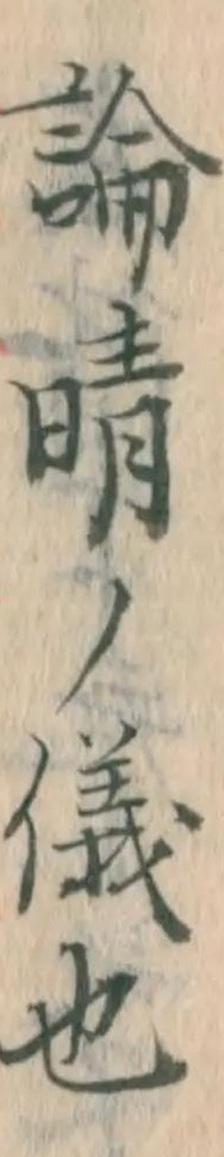論晴ノ儀也
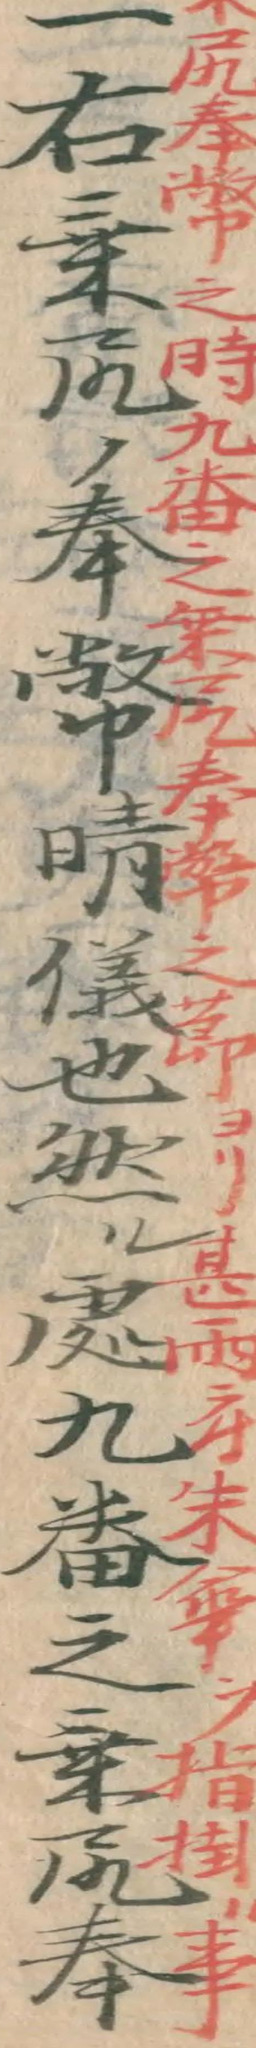一右乗尻ノ奉幣晴儀也然ル処九番之乗尻奉
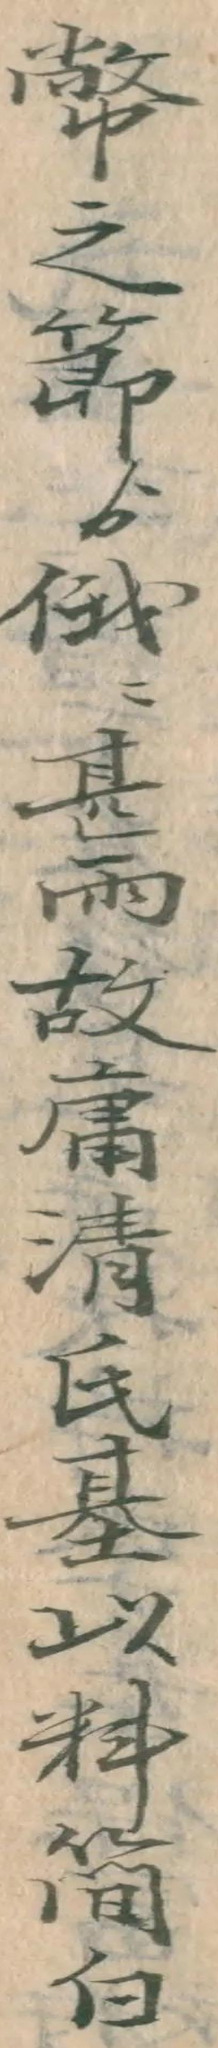幣之節ゟ俄ニ甚雨故庸清氏基以料簡白
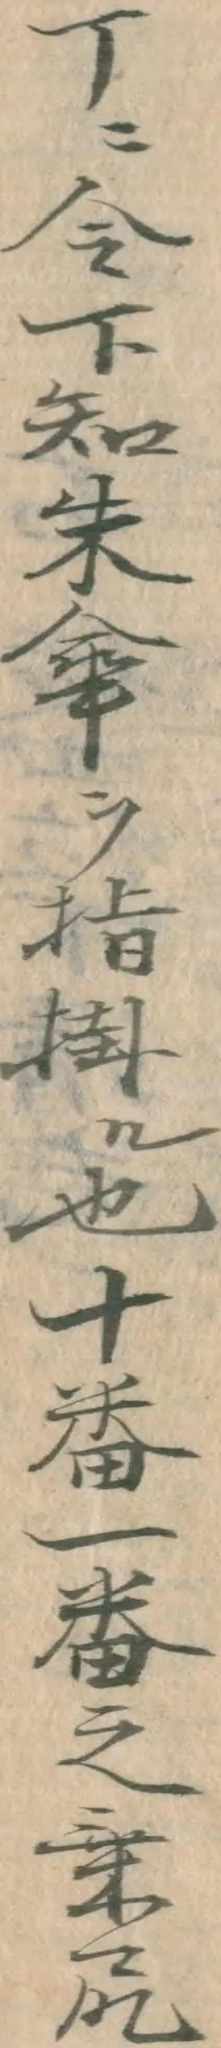丁ニ令下知朱傘ヲ指掛ル也十番一番之乗尻
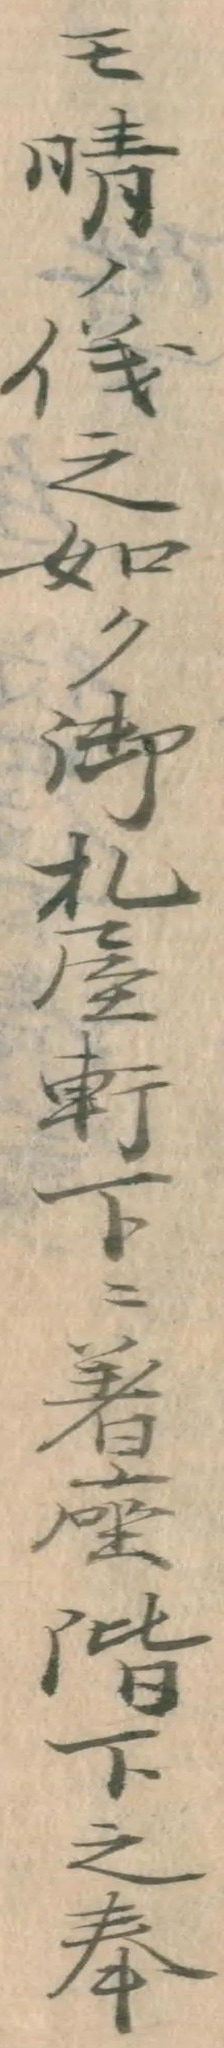モ晴ノ儀之如ク御札屋軒下ニ着座階下之奉
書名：賀茂社記録. 第10冊
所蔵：国立国会図書館 National Diet Library, JAPAN
